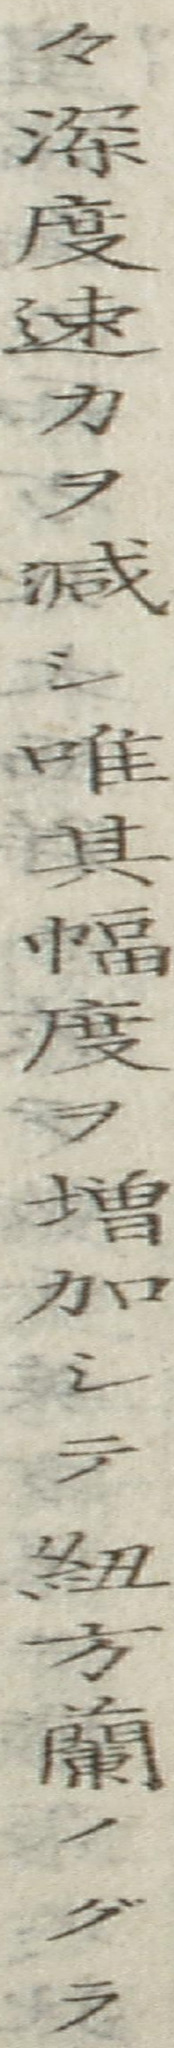々深度速力ヲ減シ唯其幅度ヲ増加シテ紐方蘭ノグラ
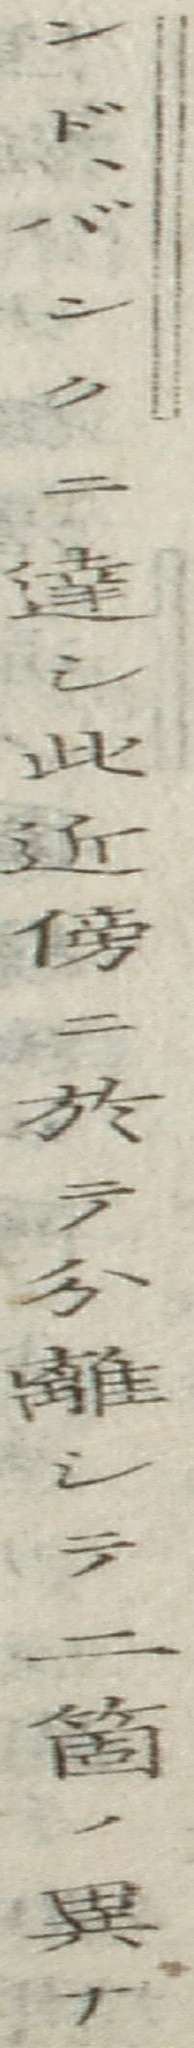ンド、バンクニ達シ此近傍ニ於テ分離シテ二箇ノ異ナ
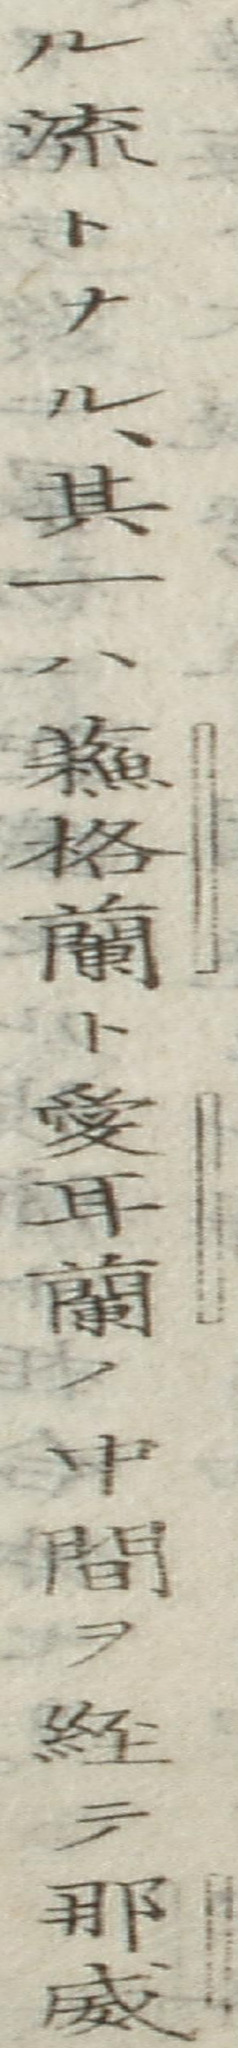ル流トナル、其一ハ蘓格蘭ト愛耳蘭ノ中間ヲ経テ那威
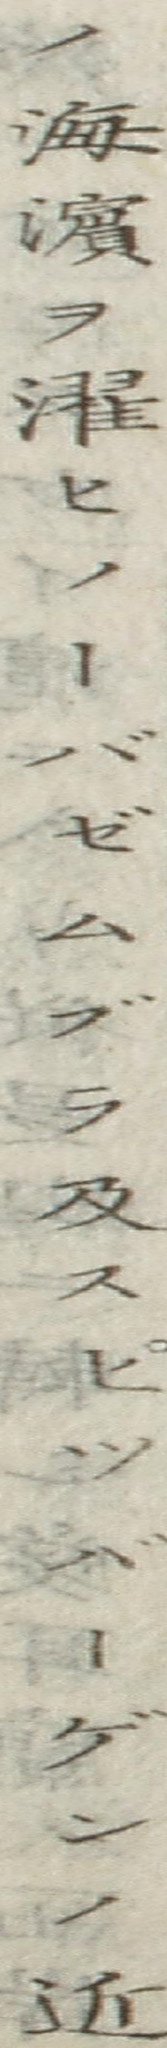ノ海浜ヲ濯ヒノーバゼムブラ及スピツバーゲンノ近
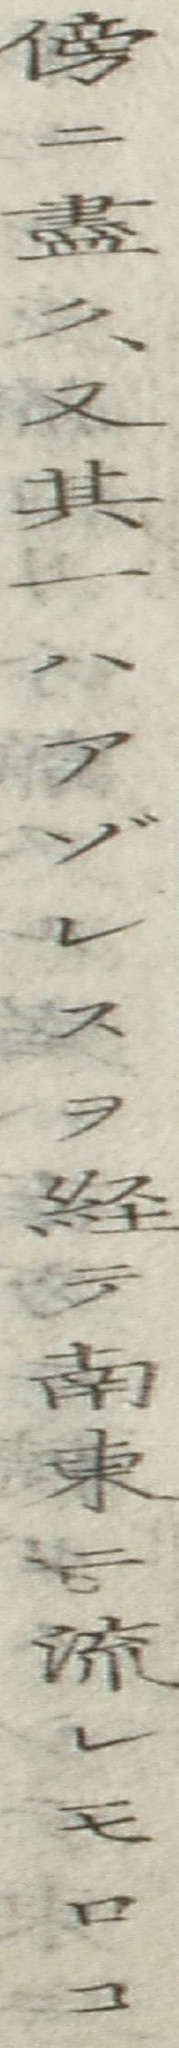傍ニ盡ク、又其一ハアゾレスヲ経テ南東ニ流レモロコ
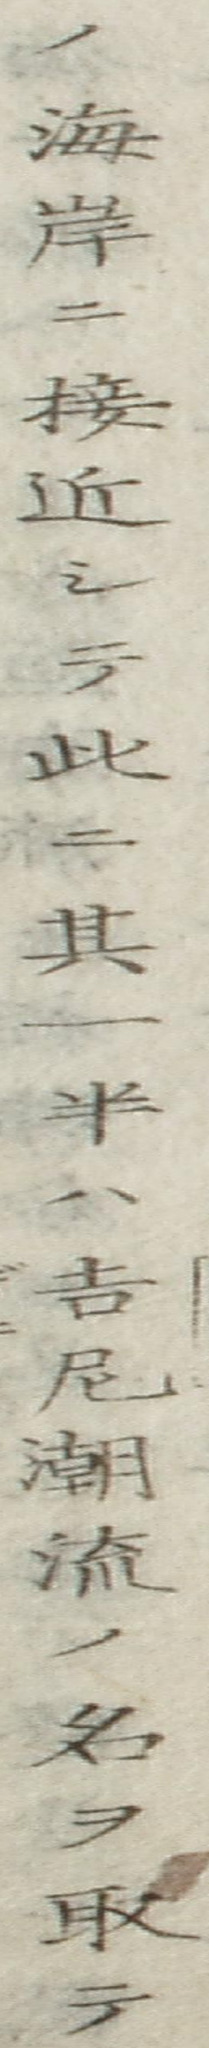ノ海岸ニ接近シテ此ニ其一半ハ吉尼潮流ノ名ヲ取テ
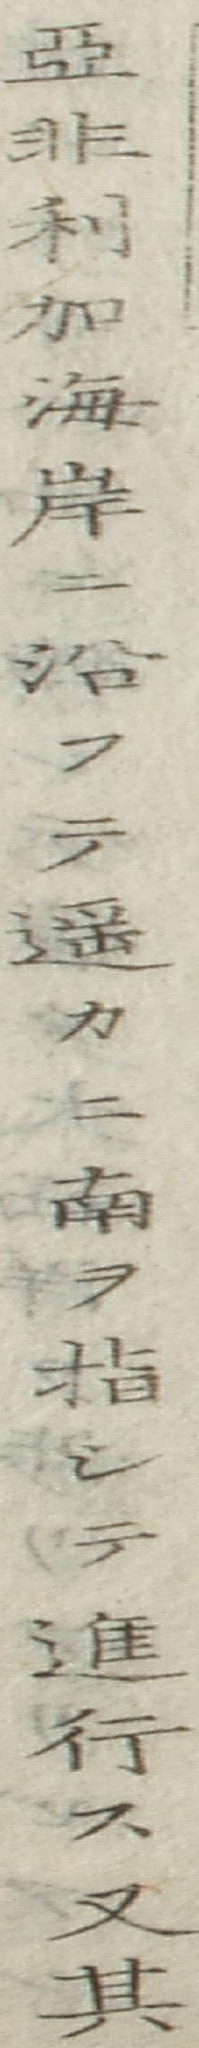亜非利加海岸ニ沿フテ遥カニ南ヲ指シテ進行ス又其

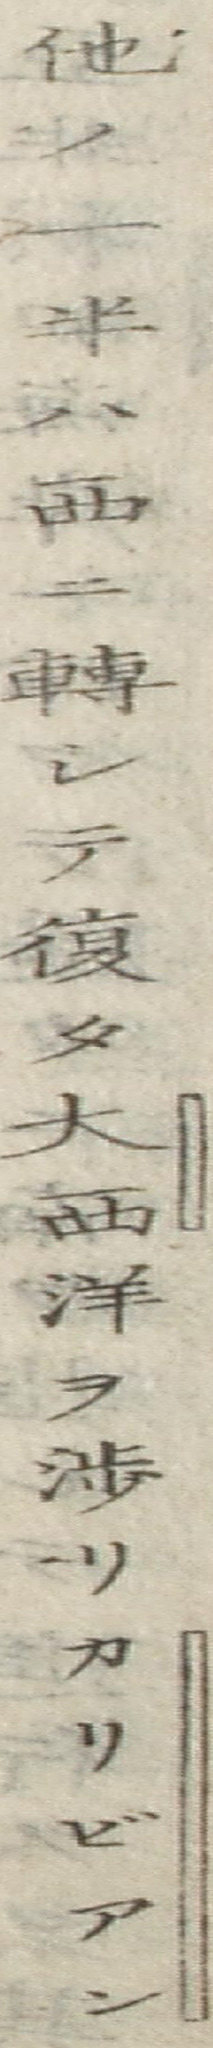他ノ一半ハ西ニ転シテ復タ大西洋ヲ渉リカリビアン
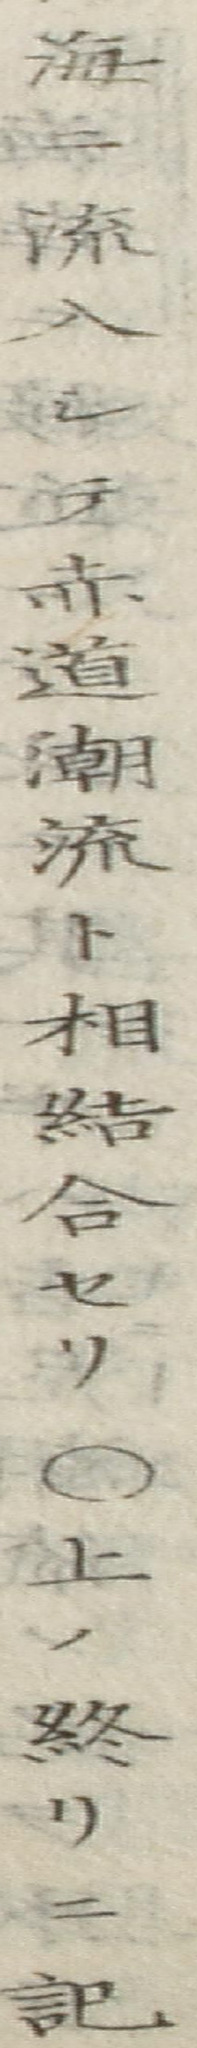海ニ流入シテ赤道潮流ト相結合セリ○上ノ終リニ記
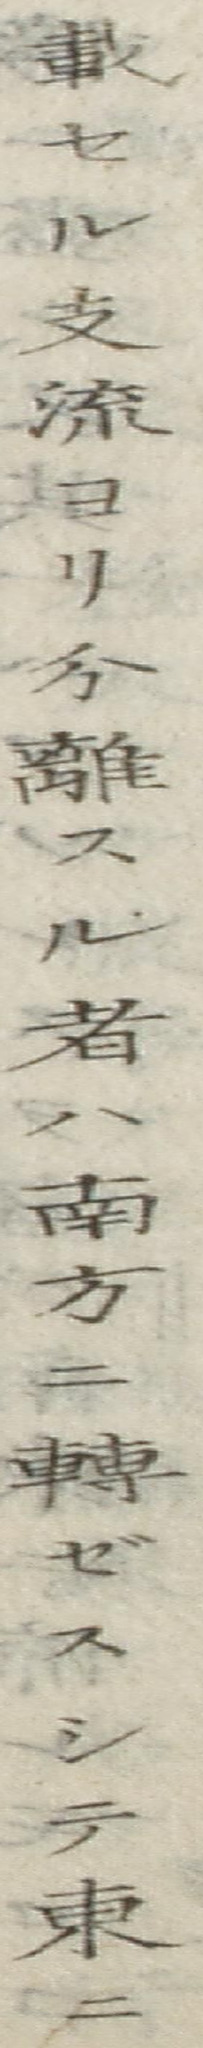載セル支流ヨリ分離スル者ハ南方ニ転ゼスシテ東ニ
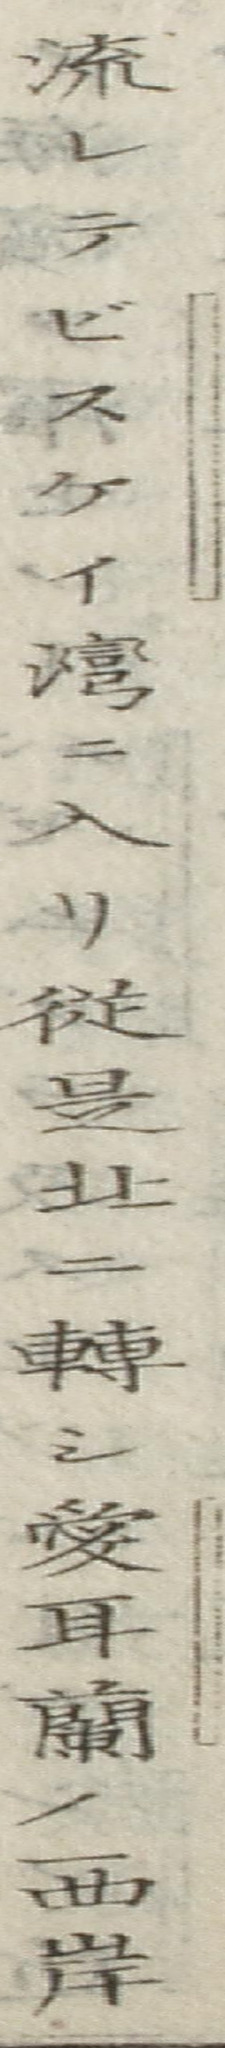流レテビスケイ湾ニ入リ従是北ニ転シ愛耳蘭ノ西岸
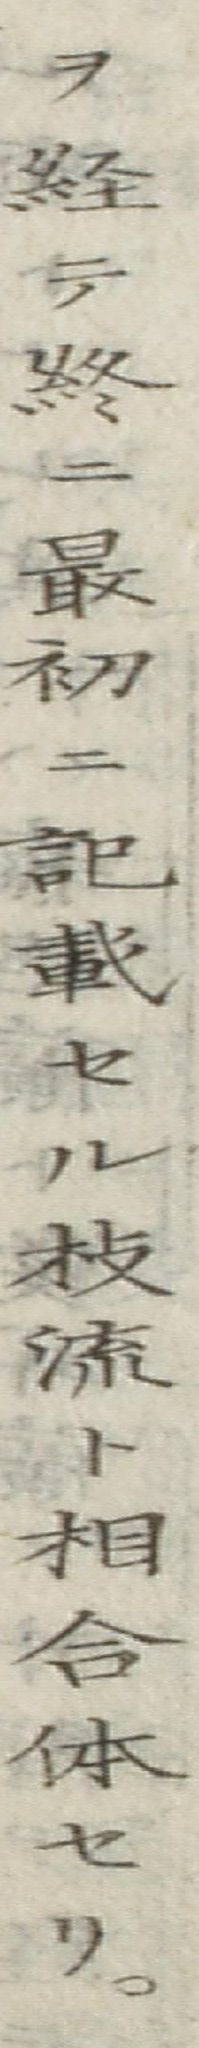ヲ経テ終ニ最初ニ記載セル枝流ト相合体セリ。
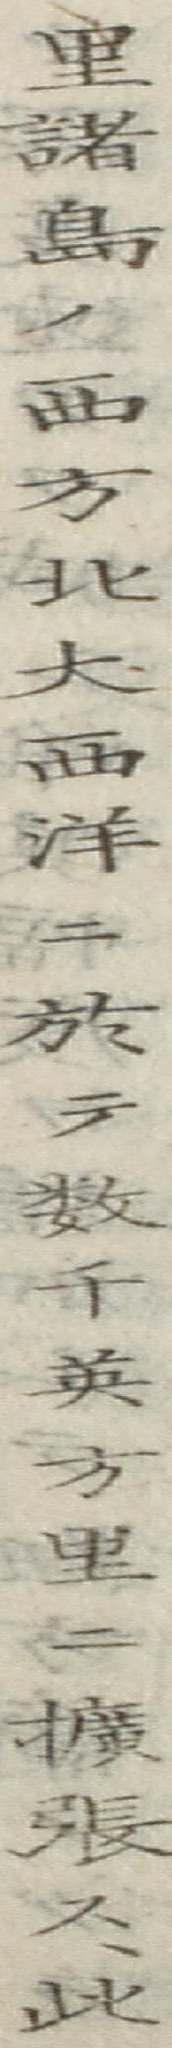里諸島ノ西方北大西洋ニ於テ数千英方里ニ拡張ス、此
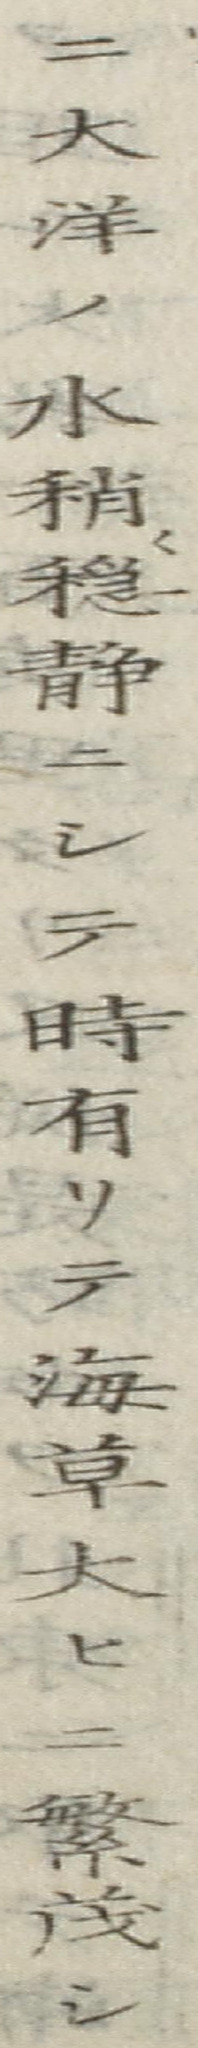ニ大洋ノ水稍々穏静ニシテ時有リテ海草大ヒニ繁茂シ
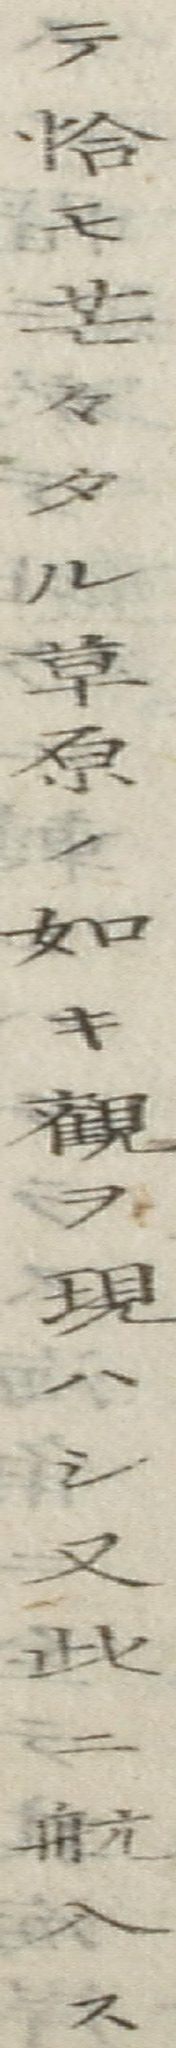テ恰モ芒々タル草原ノ如キ観ヲ現ハシ又此ニ航入ス
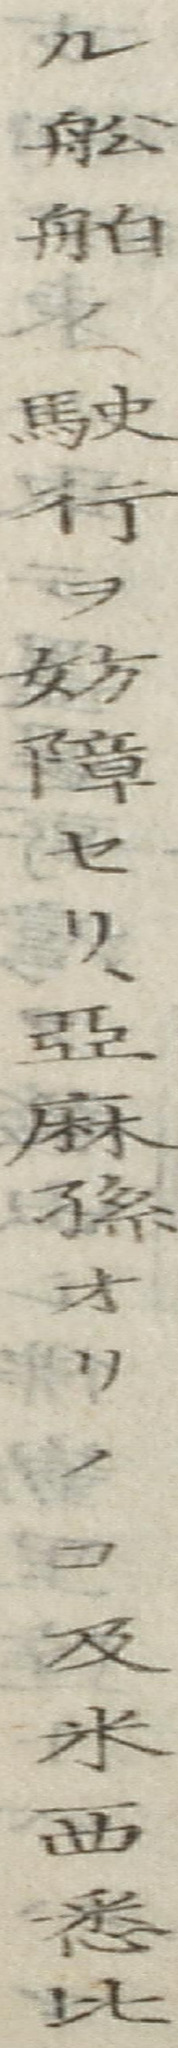ル船舶ノ駛行ヲ妨障セリ、亜麻孫オリノコ及米西悉比
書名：地形論　巻二
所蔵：東京大学地震研究所図書室 Earthquake Research Institute Library, The University of Tokyo, JAPAN
